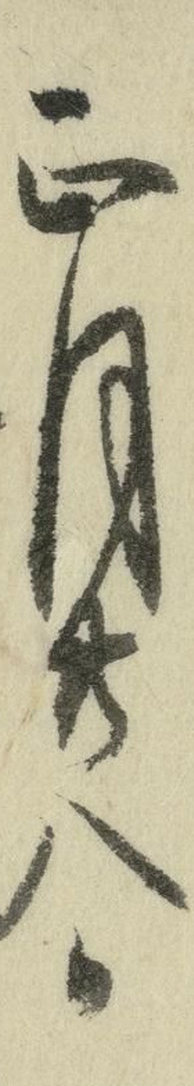正月廿八日
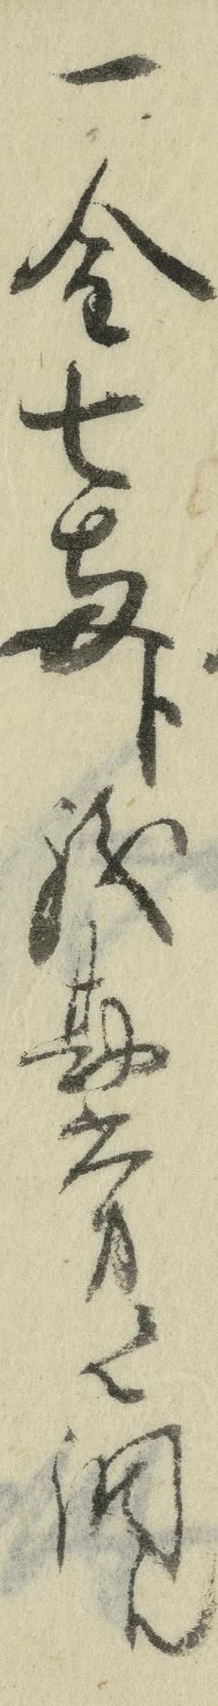一金七両ト銭勘定方二て調ㇽ
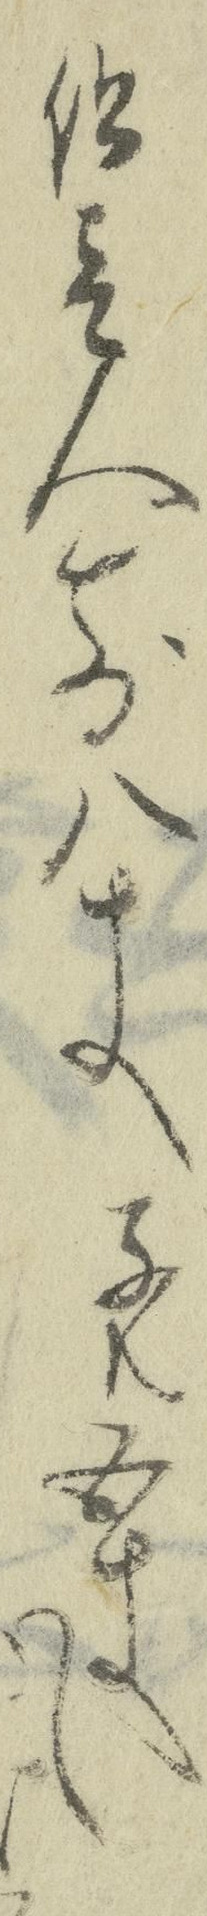但壱人前八十文子共五十文ツゝ

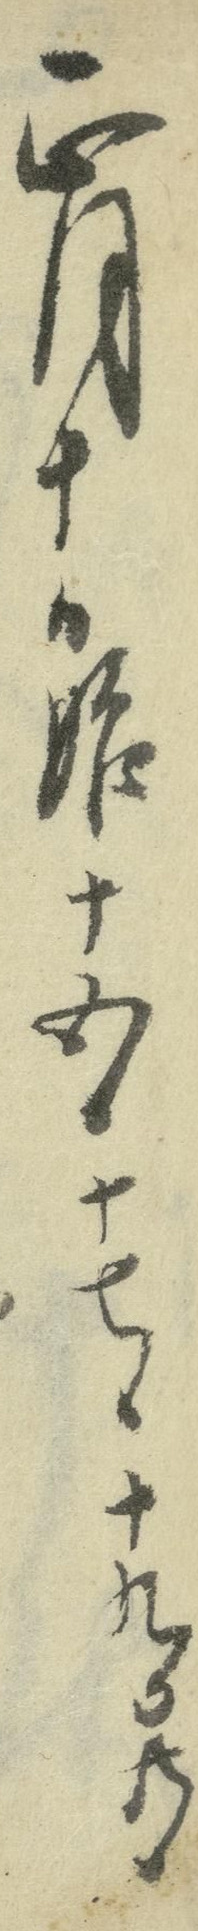正月十日始十五日十七日十九日廿日
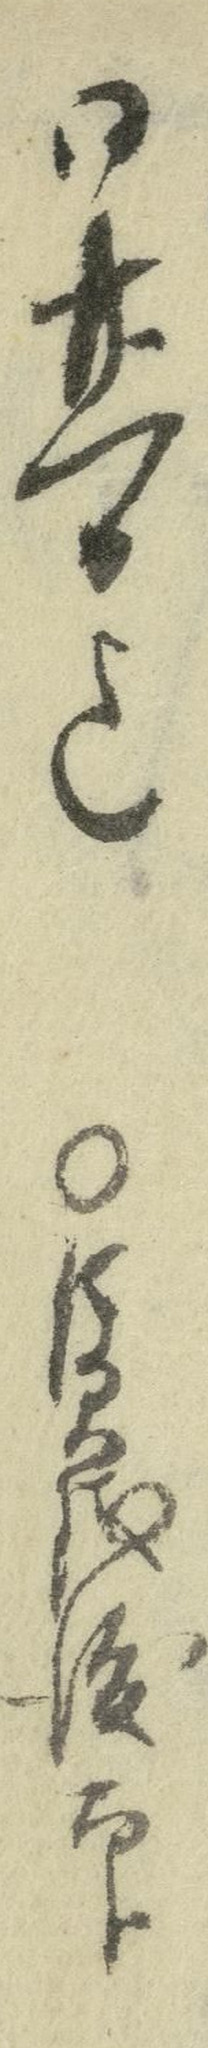同廿一日迄○賃銭渡印
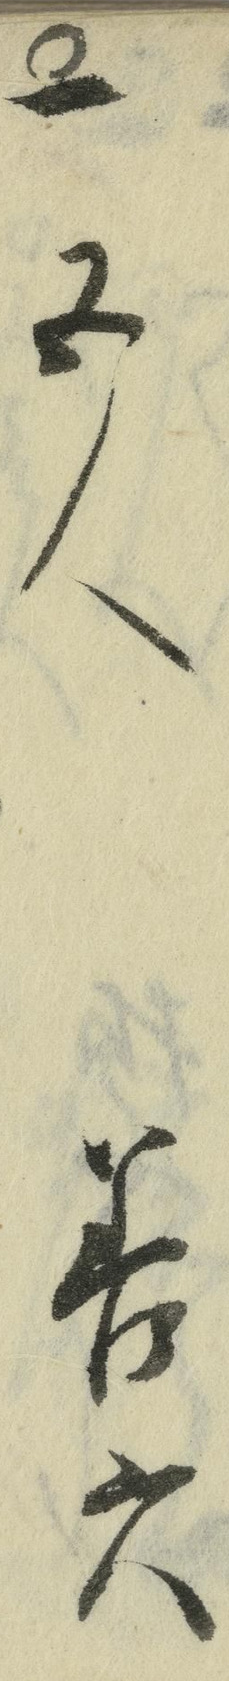○一五人善六
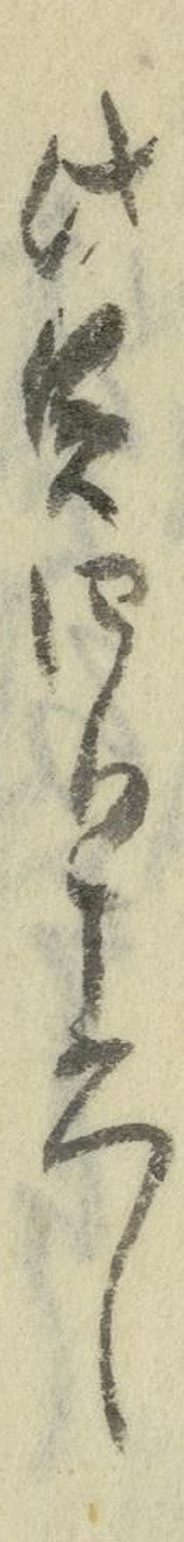此賃四百十六文
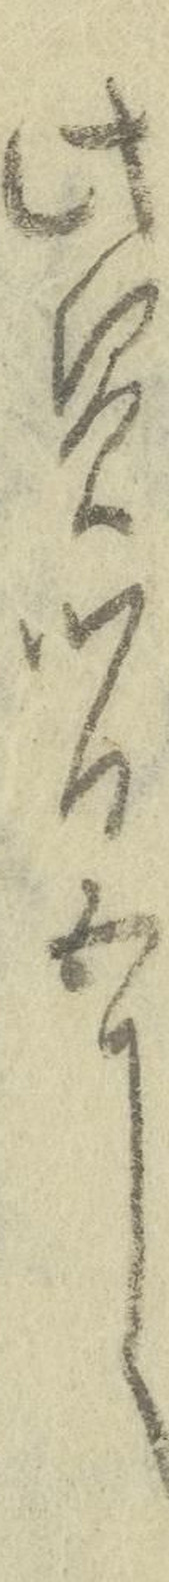此賃五百八十文
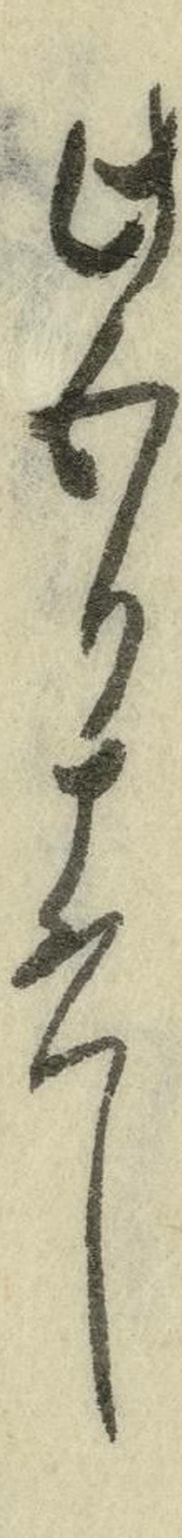此五百十六文
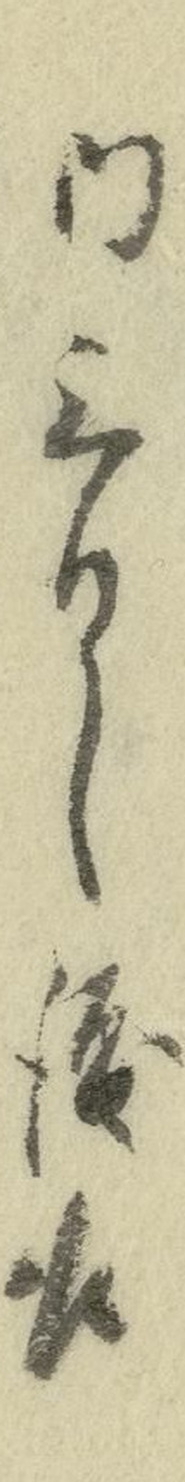内三百文渡取
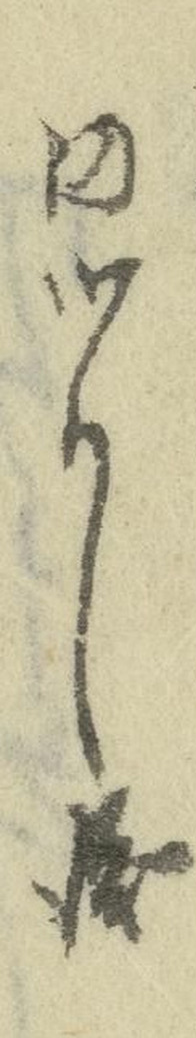内弐百文渡
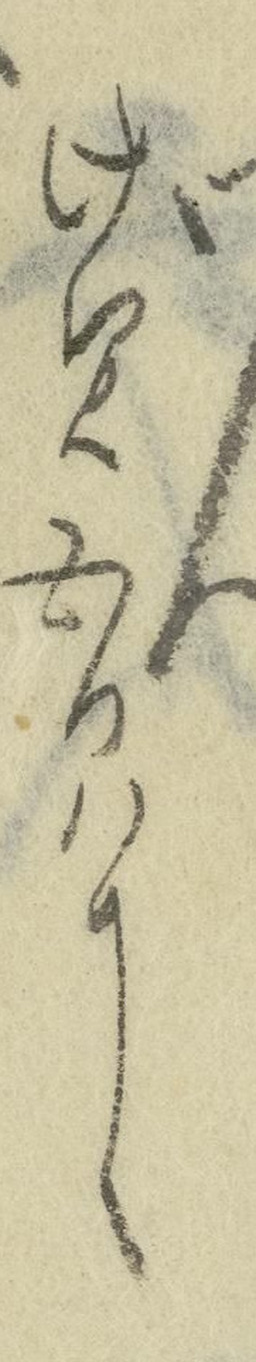此賃五百八十文
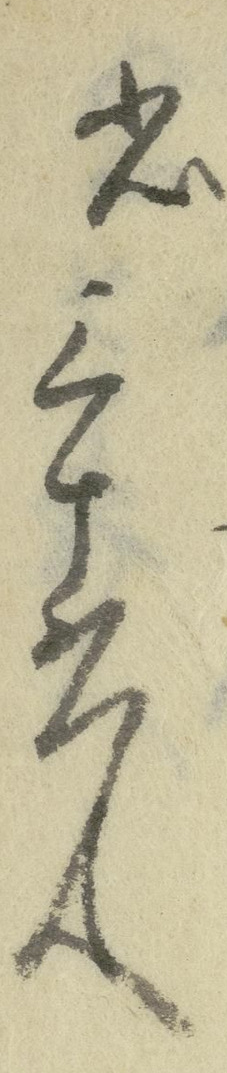小以三十六人

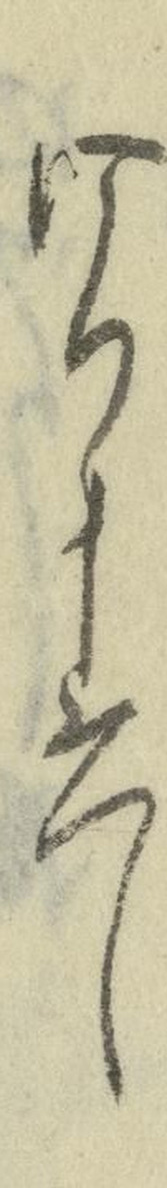四百十六文
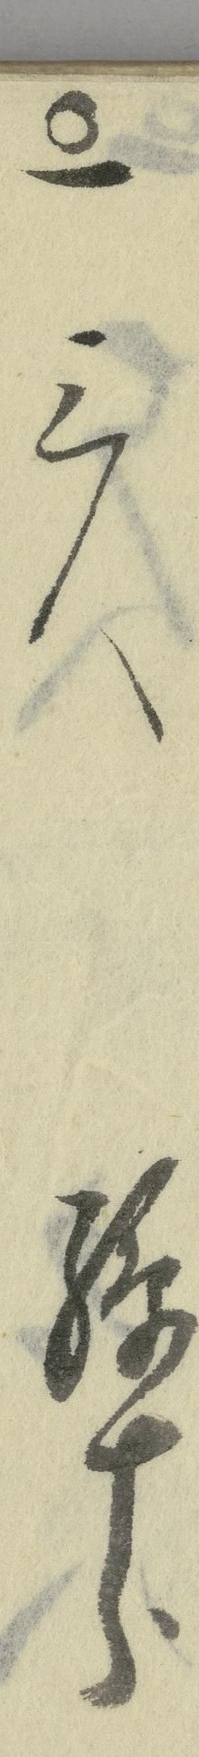○一三人中孫十郎
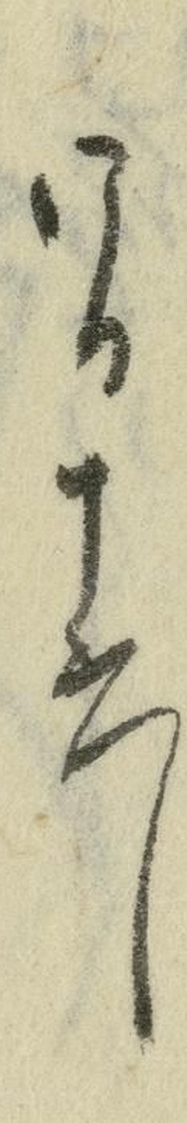四百十六文
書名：天明淺間噴火ニ関スル書類
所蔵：東京大学地震研究所図書室 Earthquake Research Institute Library, The University of Tokyo, JAPAN
